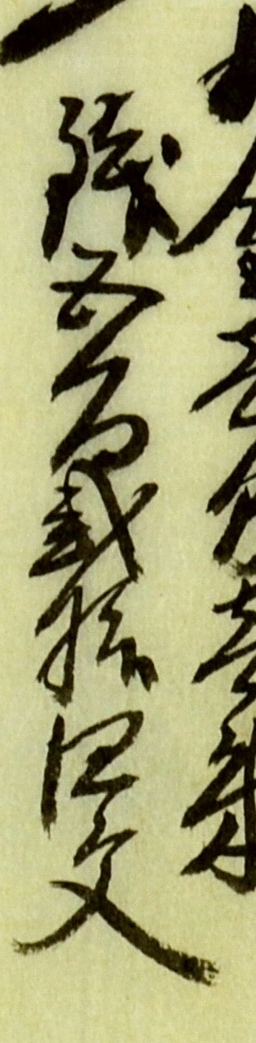銭五百弐拾四文

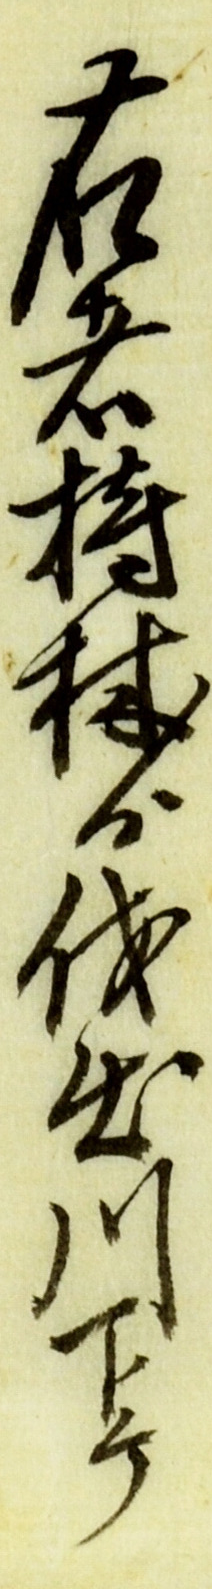右者持林ゟ伐出川下ヶ
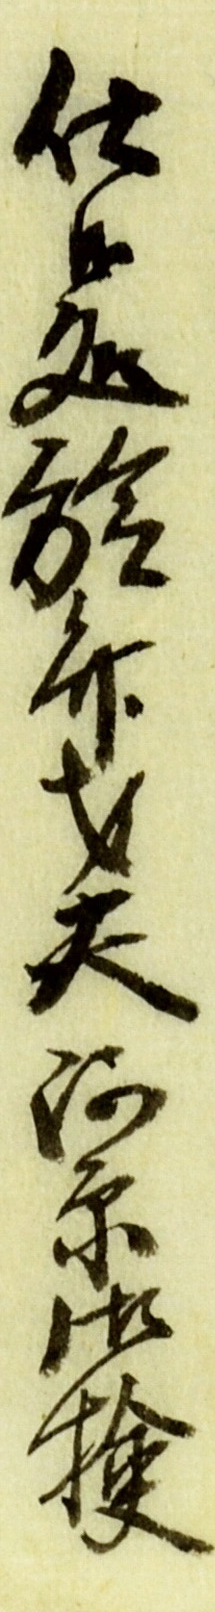仕候処於弁才天河原御検
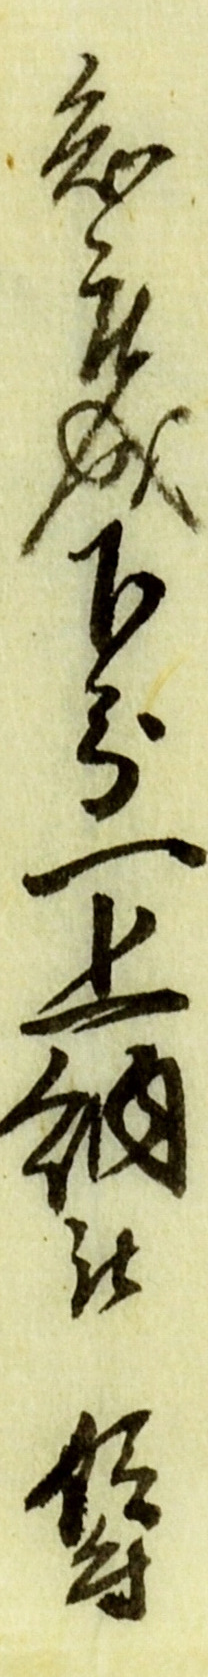知被成下分一上納被仰付
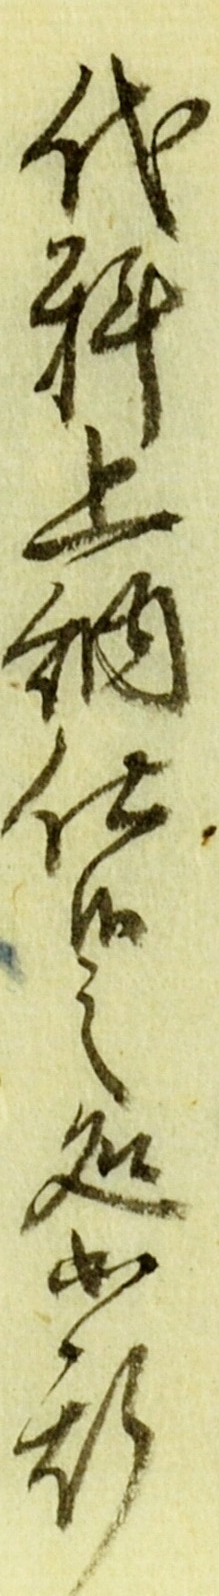代料上納仕候之処如斯
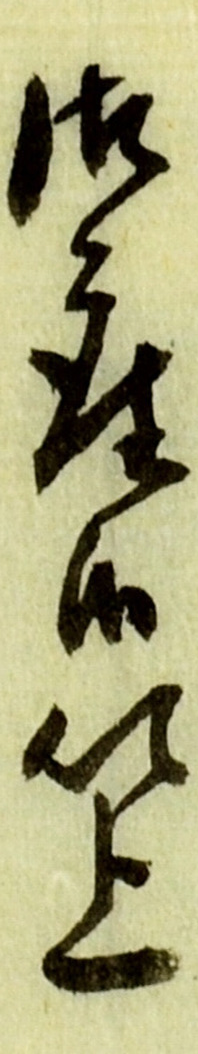御座候以上
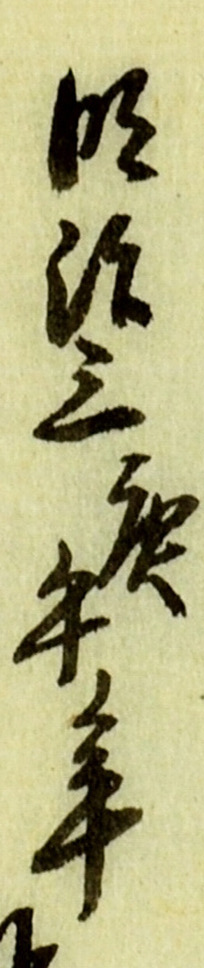明治三庚午年
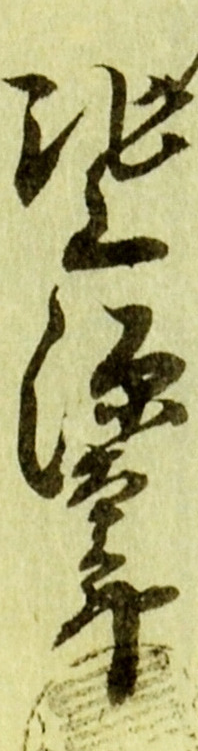池上源太郎
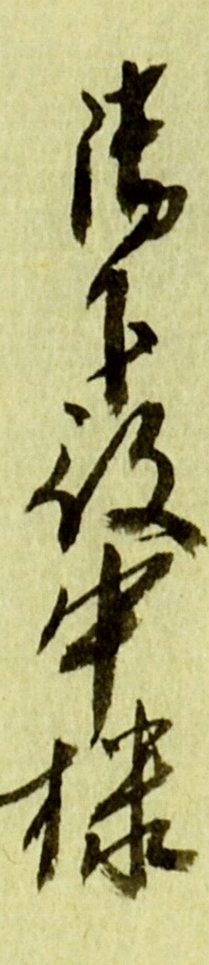御下役中様

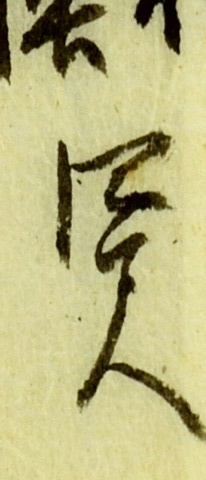同六尺
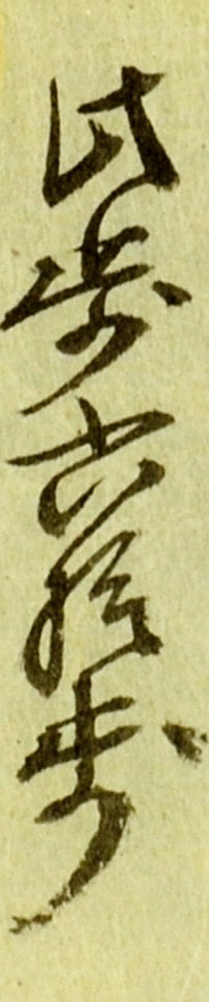此歩六拾歩
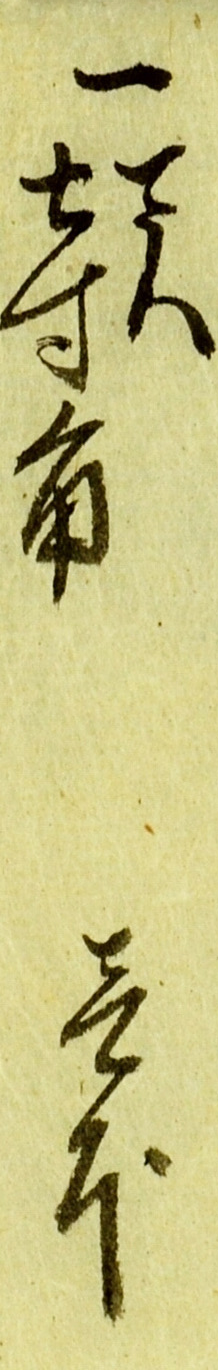一五寸角弐本
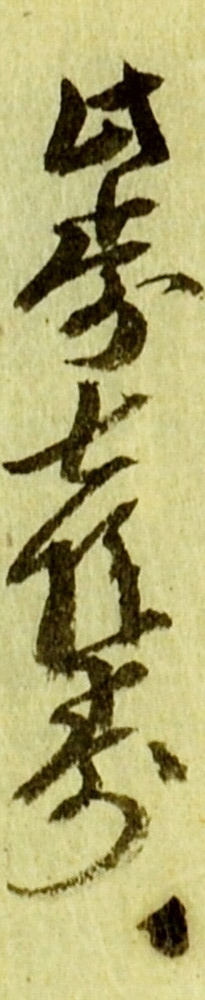此歩七拾歩
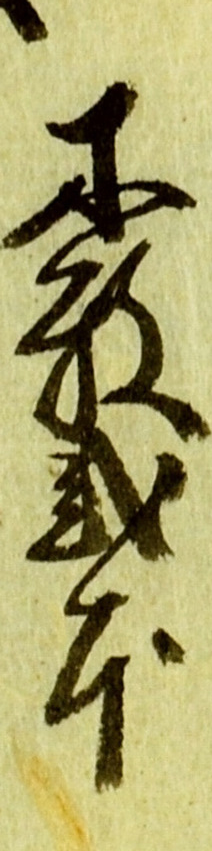木数弐本
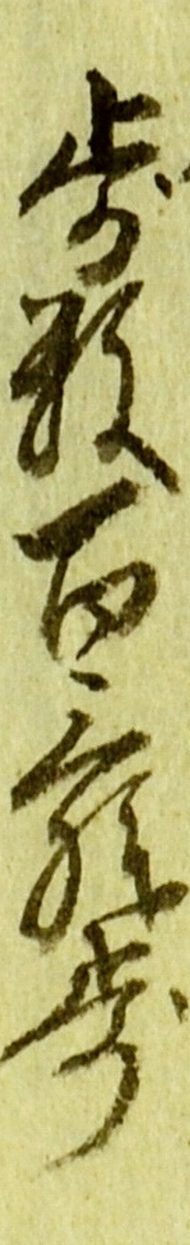〆歩数百三拾歩
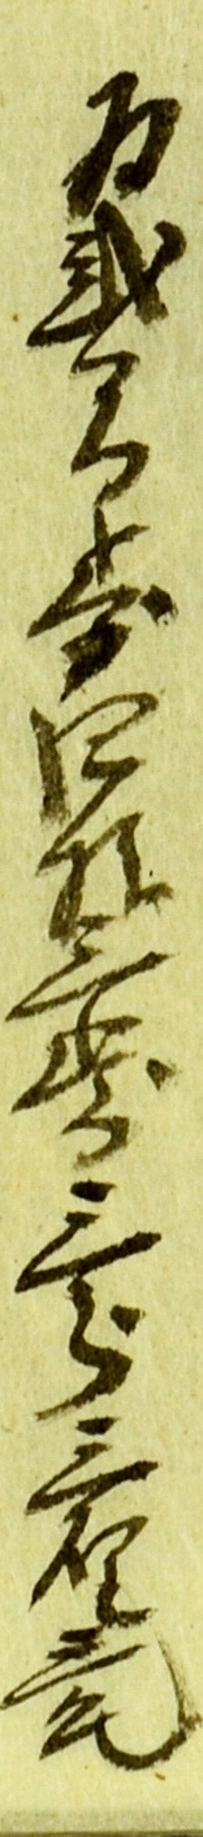為弐間歩四拾三歩三分三厘三毛
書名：材木川下ケ分一上納帳
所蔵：伊那市立高遠町図書館・合同会社AMANE
